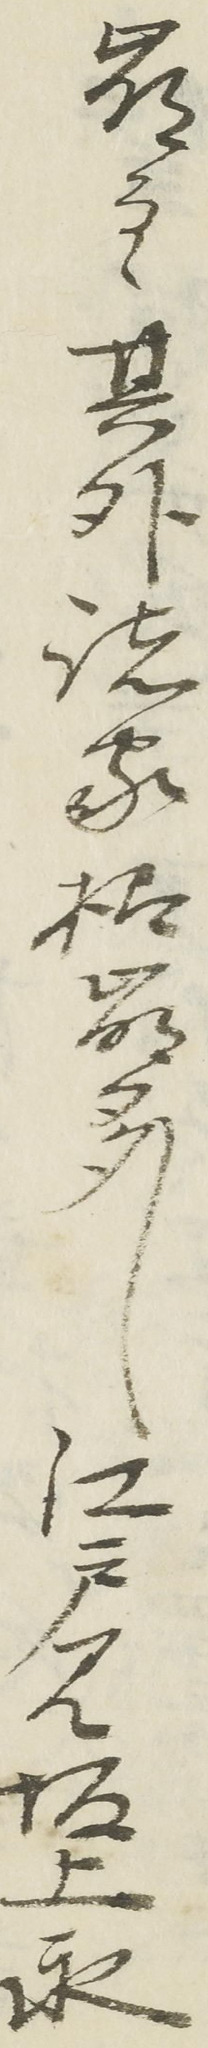崩るゝ其外諸家様崩多し江戸見坂上永
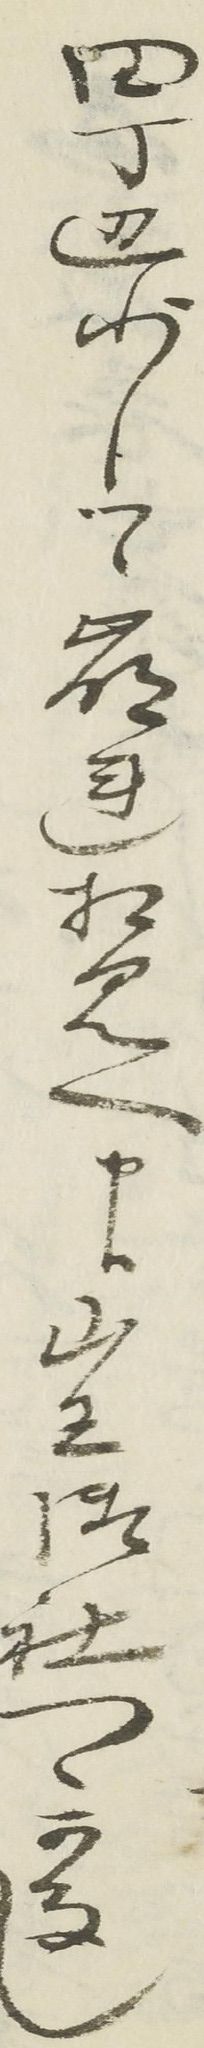田丁辺少しツヽ崩れ相見へ申候山王御社つゝかなし
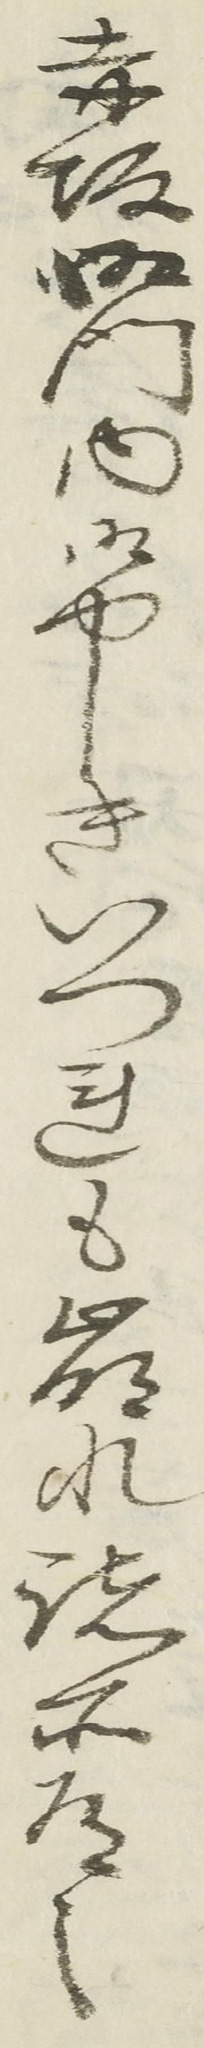赤坂御門内御やしきいつれも崩れ諸所有之
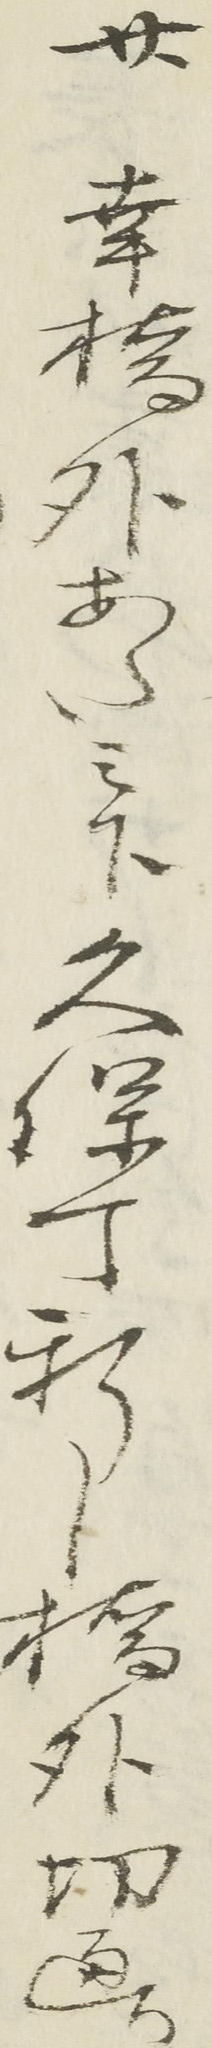廿幸橋外あたミ下久保丁新し橋外切通り
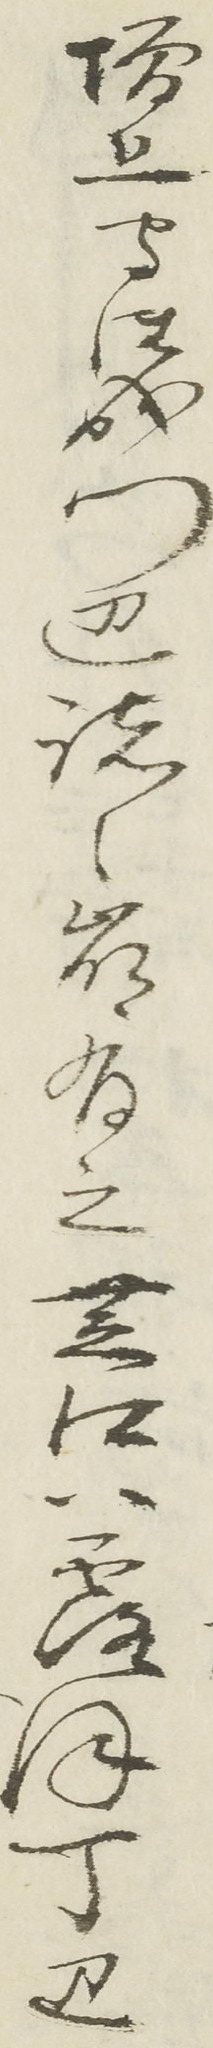増上寺御成門辺諸〻崩有之芝口ハ露月丁辺
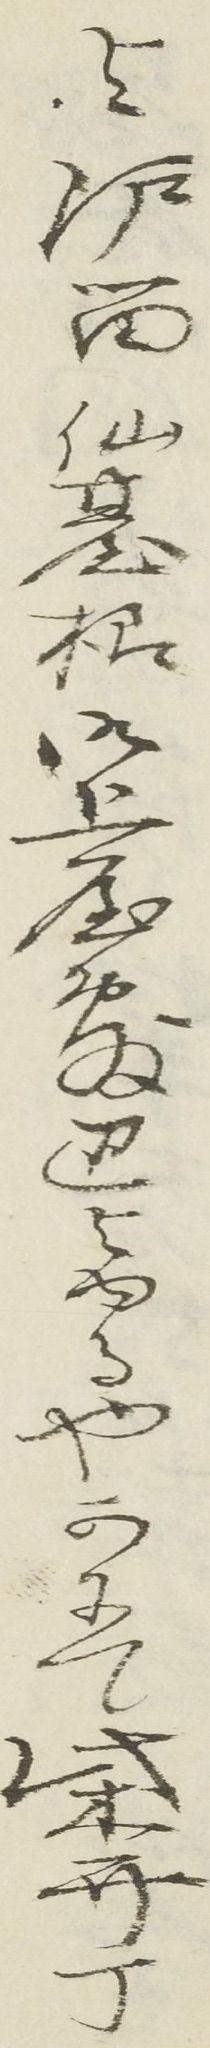と汐留仙台様御上屋敷辺とゆるやかにて柴井丁
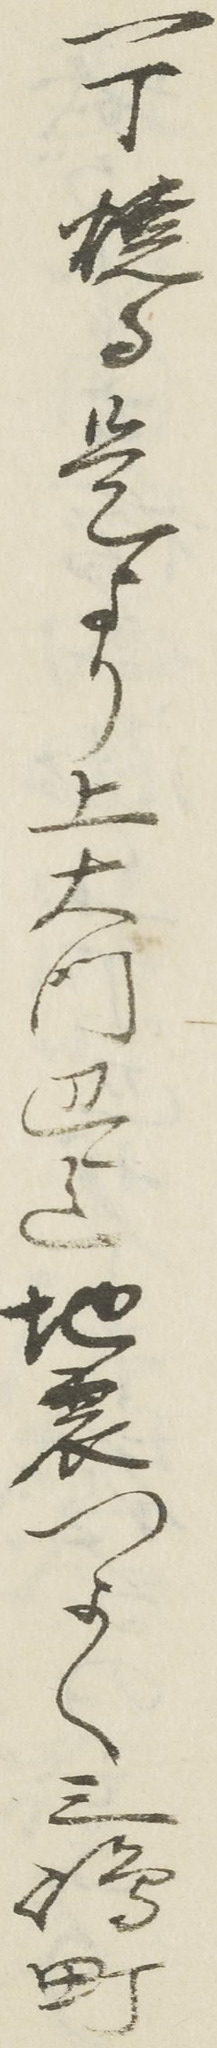一丁焼る是より上大門辺迄地震つよく三嶋町
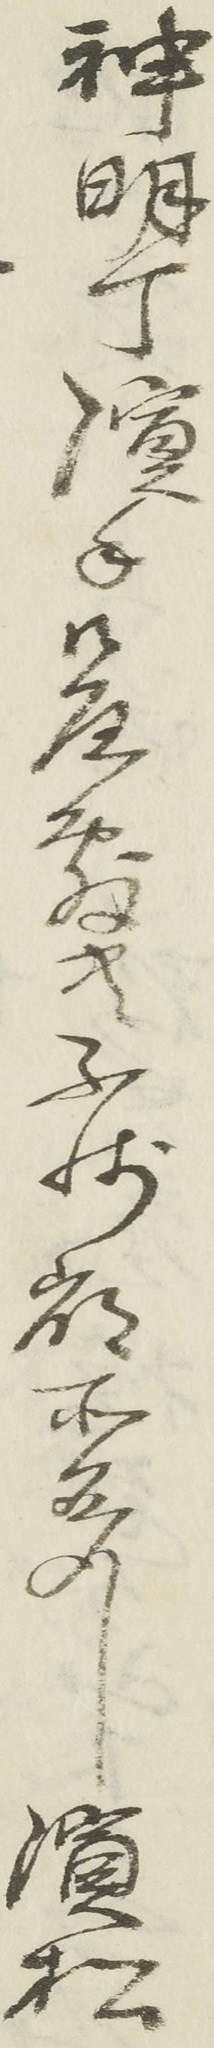神明丁濱手御屋敷共不残崩所多し濱松
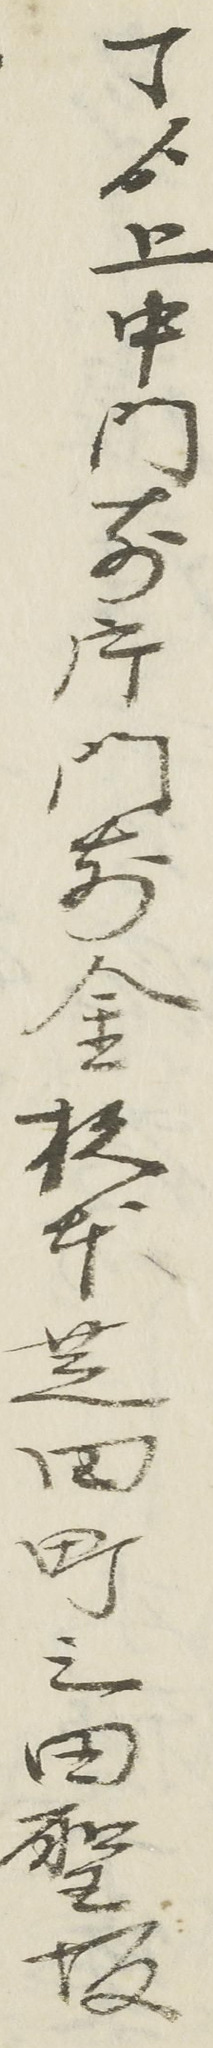丁ゟ上中門前片門前金杉本芝田町三田聖坂
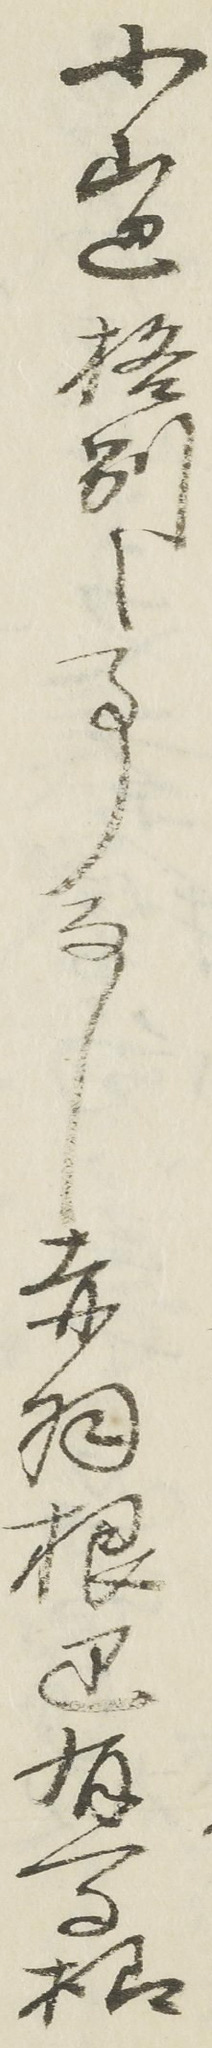小山辺格別之事なし赤羽根辺有馬様
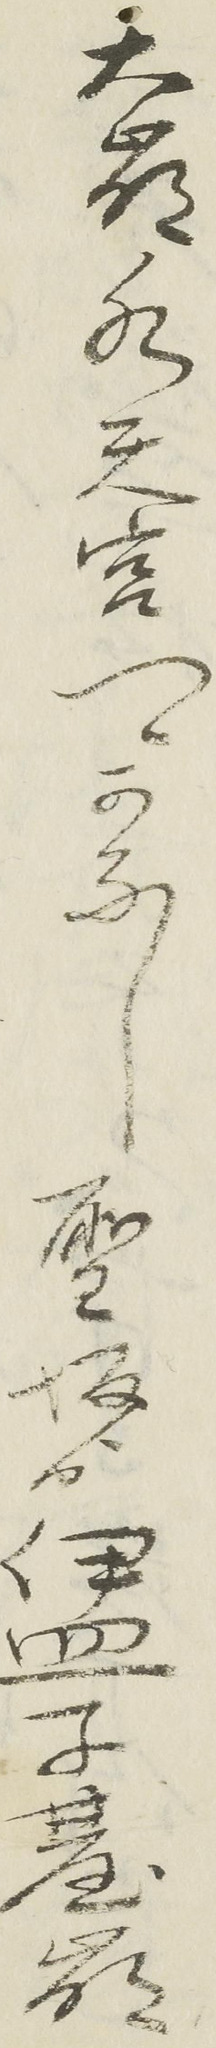大崩水天宮つゝかなし聖坂ゟ伊皿子臺崩
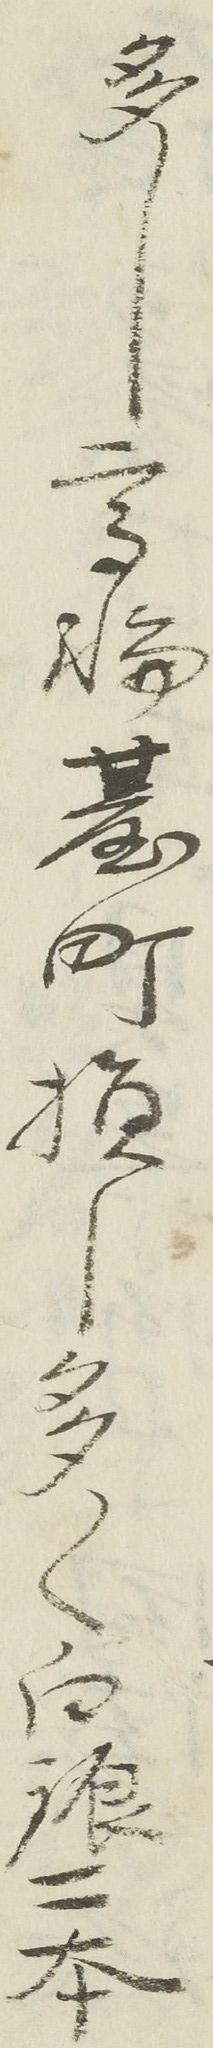多し高輪臺町損し多く白銀二本
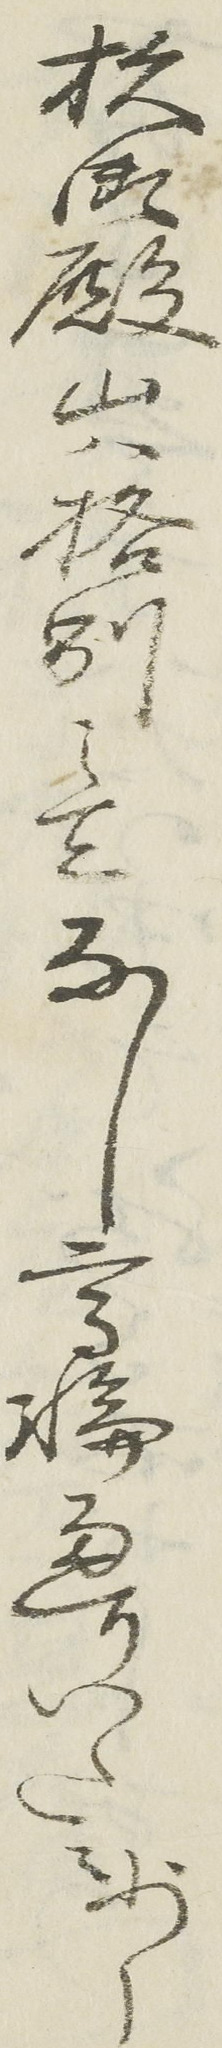杉御殿山ハ格別之ことなし高輪通りいたミ少し
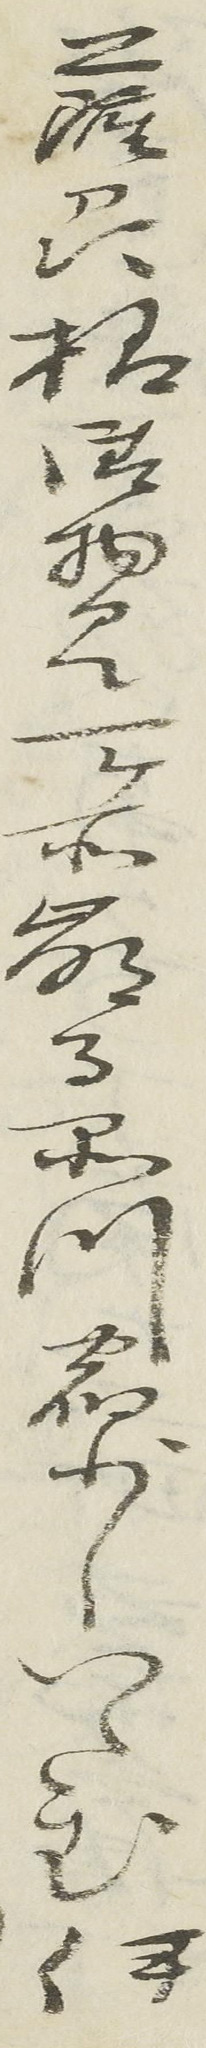薩州様御物見一ケ所崩る品川宿少しいたむ伊
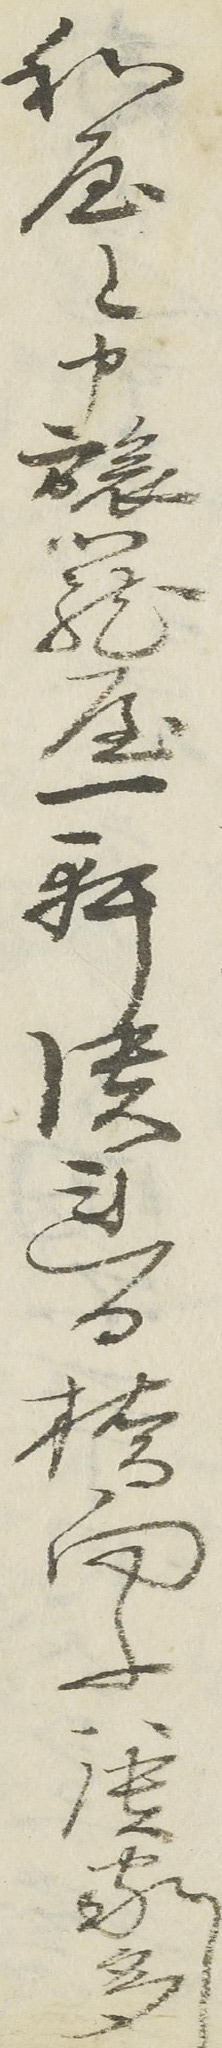和屋と申旅籠屋一軒潰れる橋向ふハ潰家多し
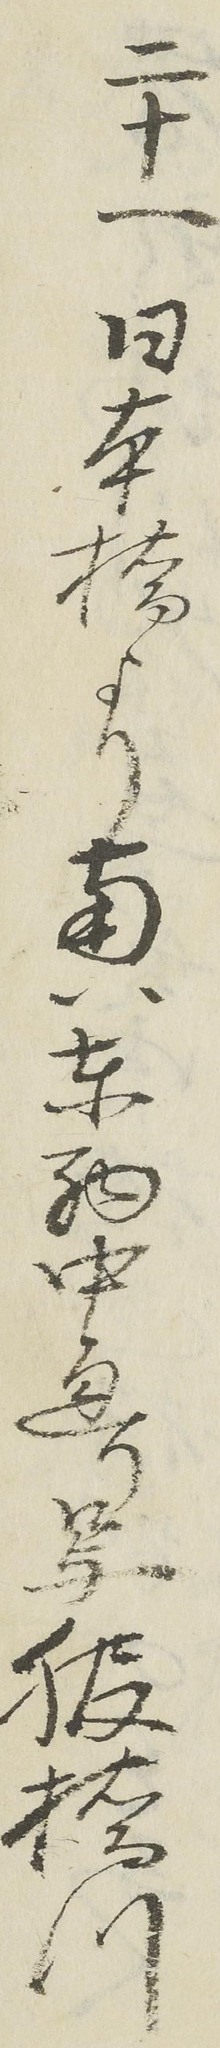二十一日本橋より南ハ東西中通り呉服橋川
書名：安政乙卯江戸大地震筆記　安政丙辰八月大阪大雷雨之記追加　安政三辰年七月松前辺大地震并八月大風雨記録
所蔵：東京大学地震研究所図書室 Earthquake Research Institute Library, The University of Tokyo, JAPAN
